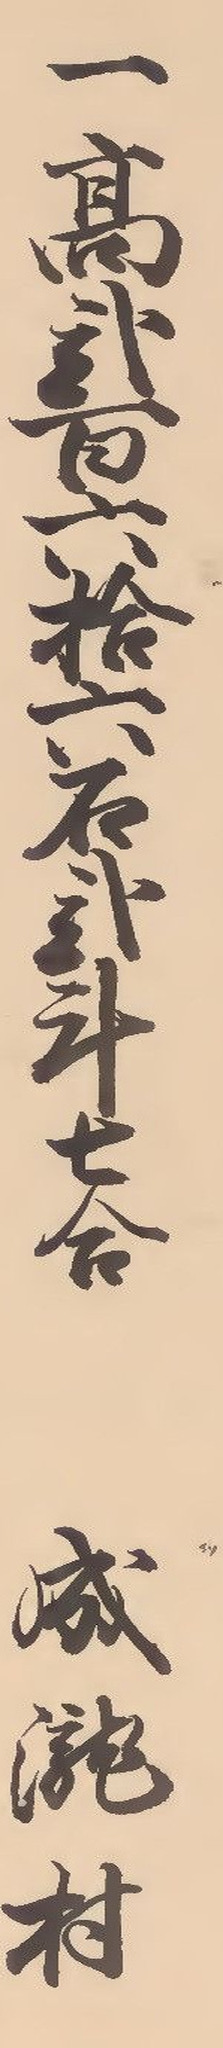一高弐百六拾六石弐斗七合成滝村
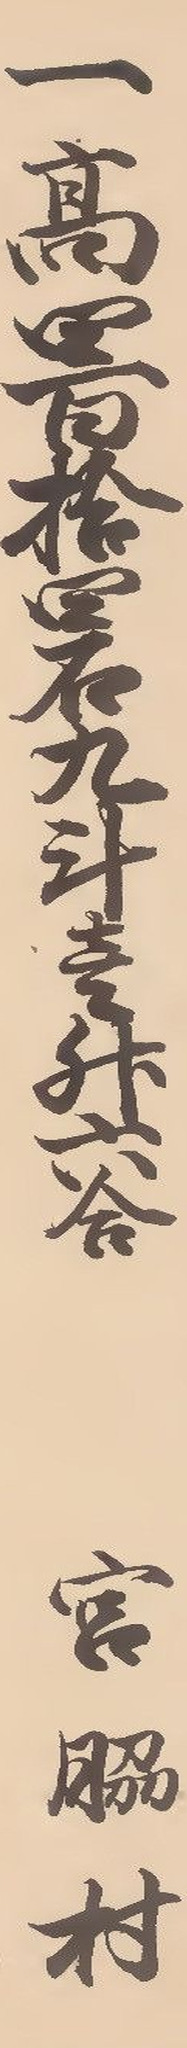一高四百拾四石九斗壱升六合宮脇村
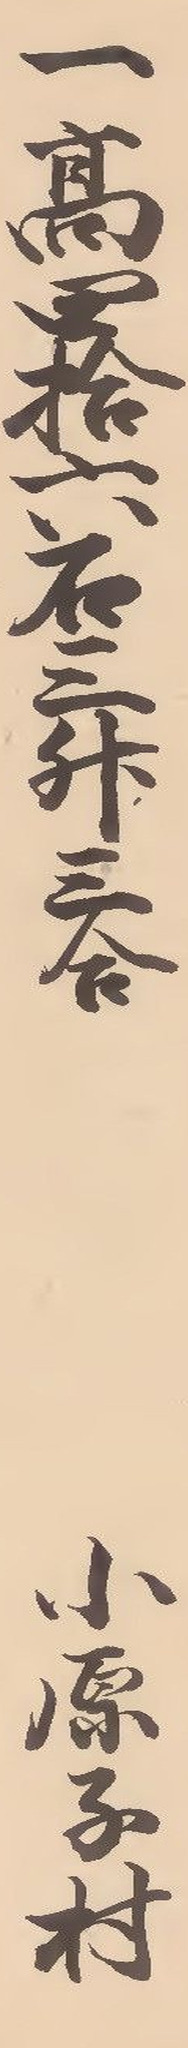一高四拾六石三升三合小原子村
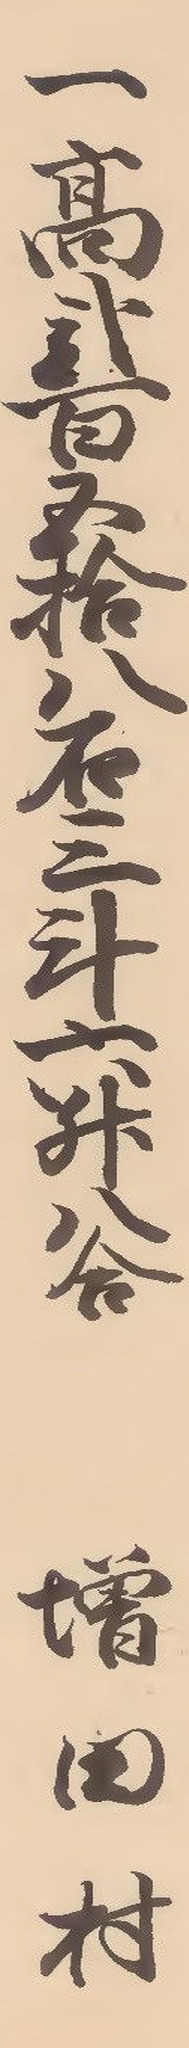一高弐百五拾八石三斗六升八合増田村
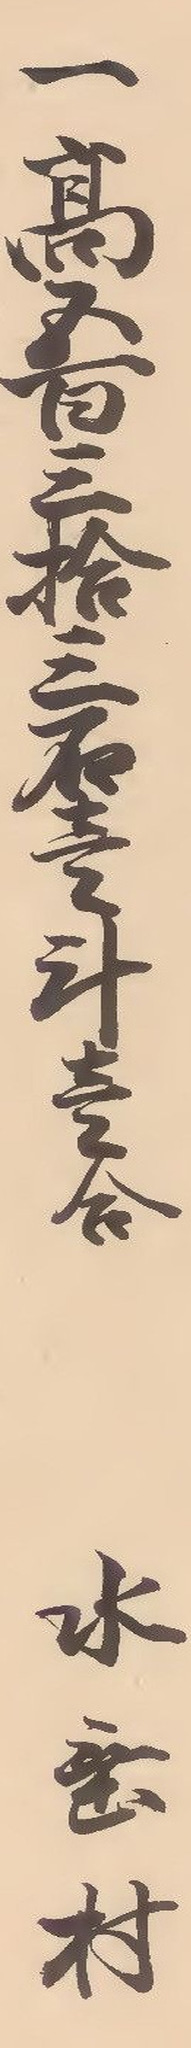一高五百三拾三石壱斗壱合水垂村

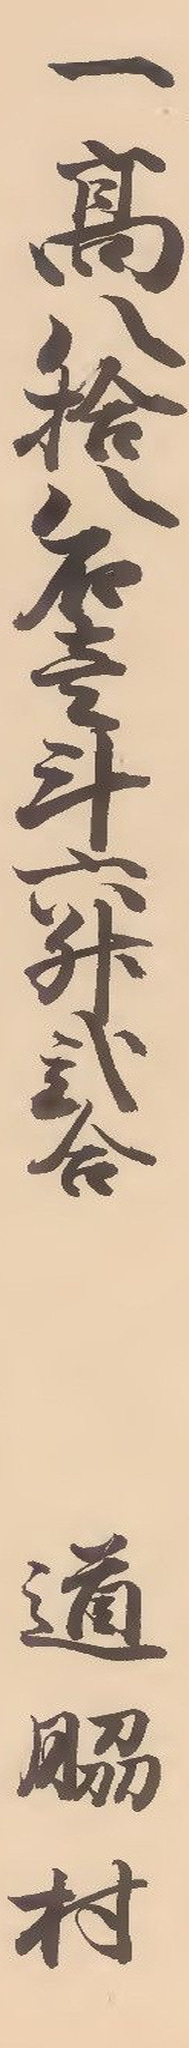一高八拾八石壱斗六升弐合道脇村
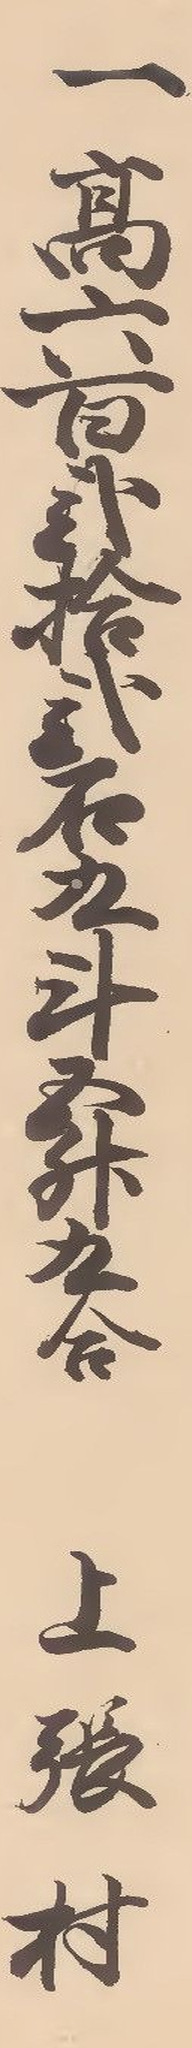一高六百弐拾弐石九斗五升九合上張村
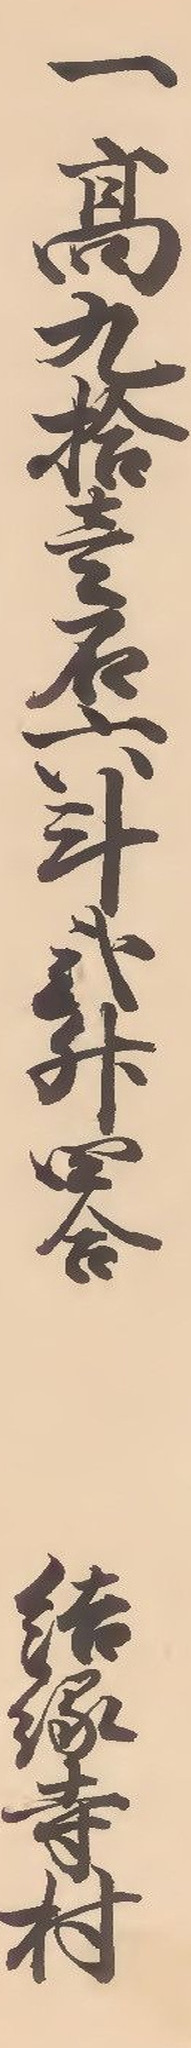一高九拾壱石六斗弐升四合結縁寺村
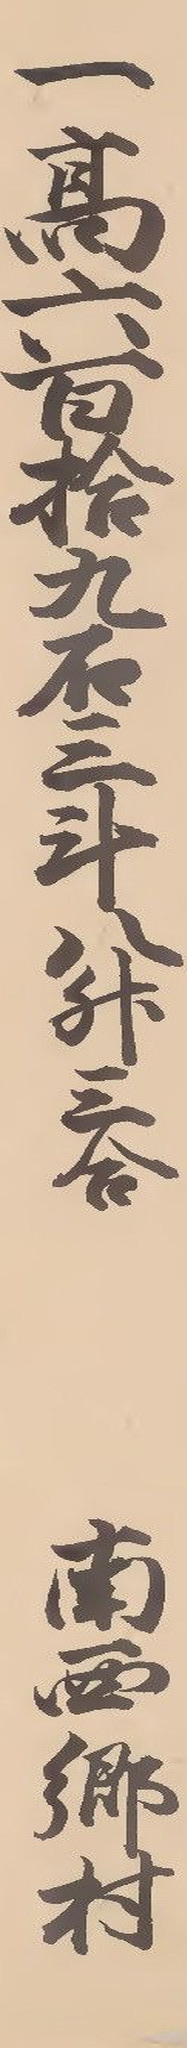一高六百拾九石三斗八升三合南西郷村
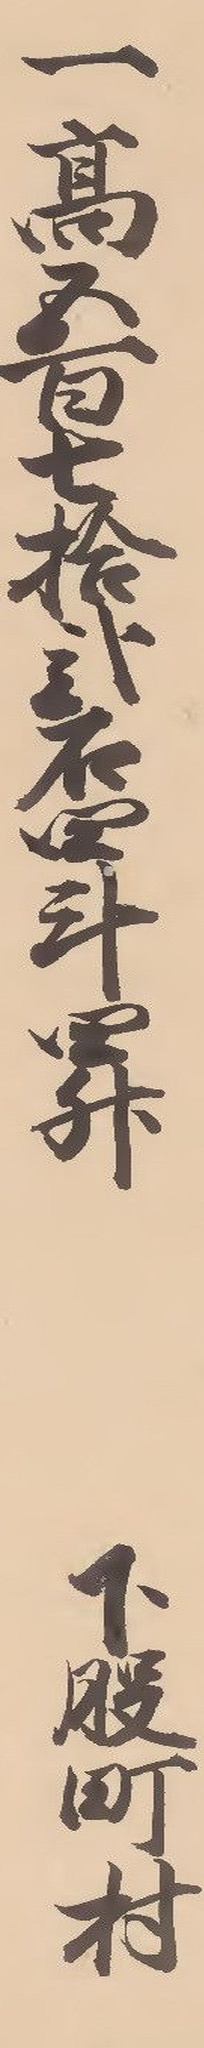一高五百七拾弐石四斗四升下股町村
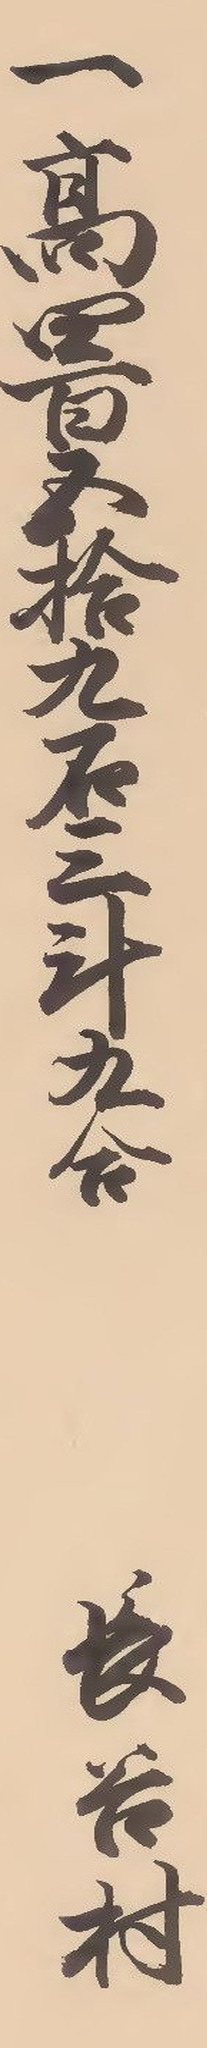一高四百五拾九石三斗九合長谷村

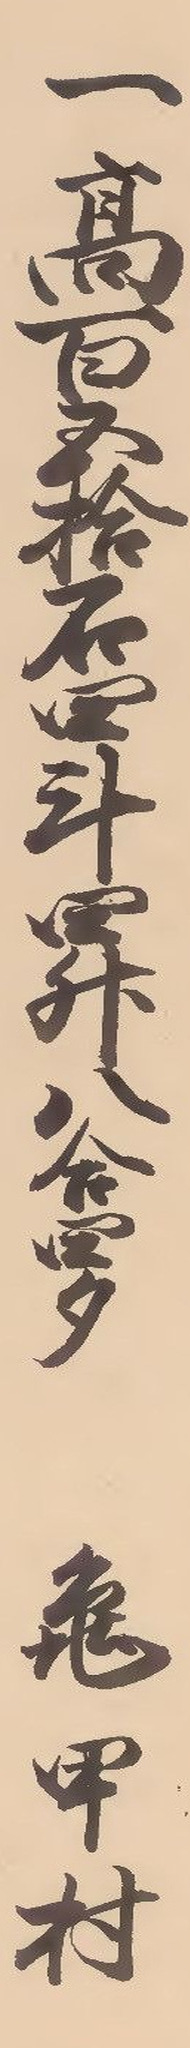一高百五拾石四斗四升八合四勺亀甲村
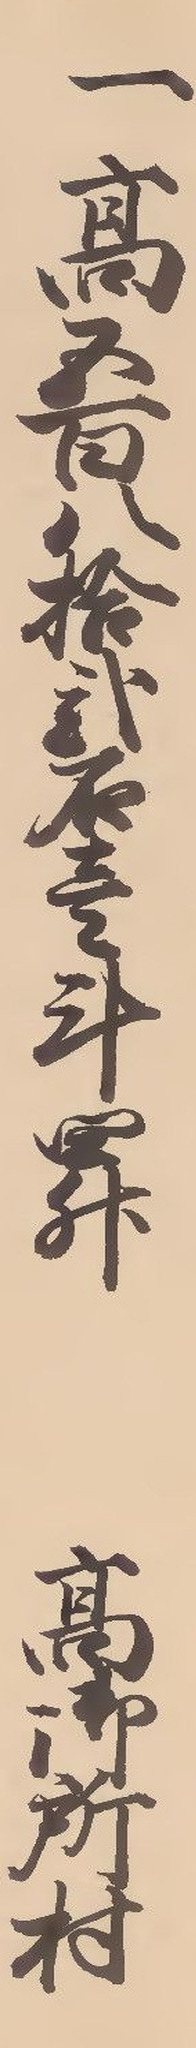一高五百八拾弐石壱斗四升高御所村
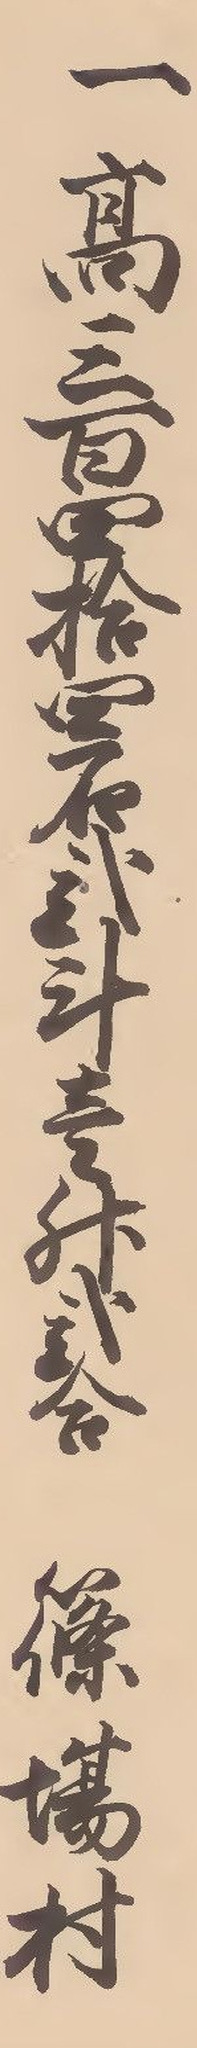一高三百四拾四石弐斗壱升弐合篠場村
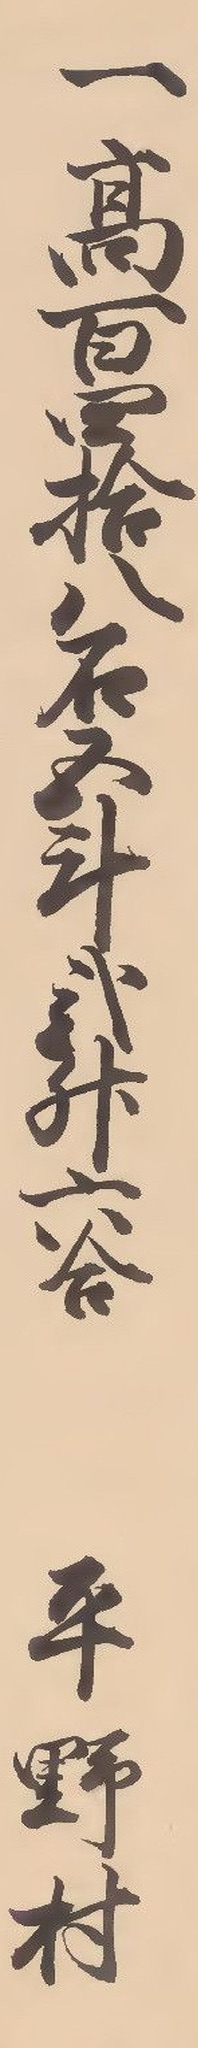一高百四拾八石五斗弐升六合平野村
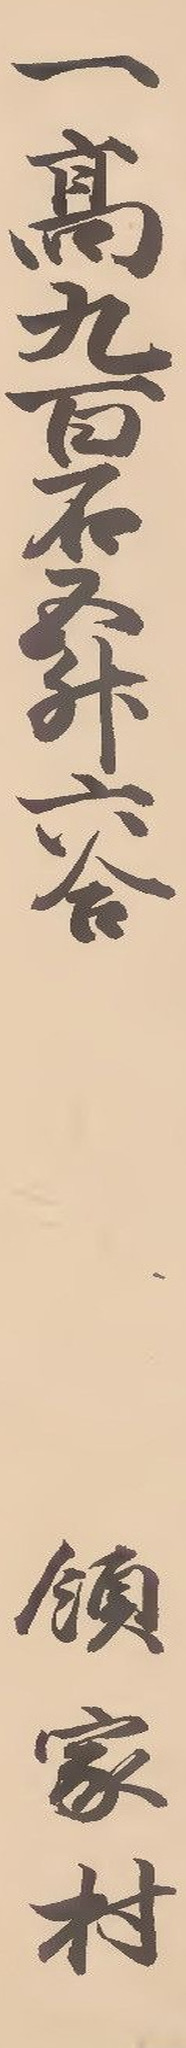一高九百石五升六合領家村
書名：遠江国郷帳
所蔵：国立公文書館 National Archives of Japan
